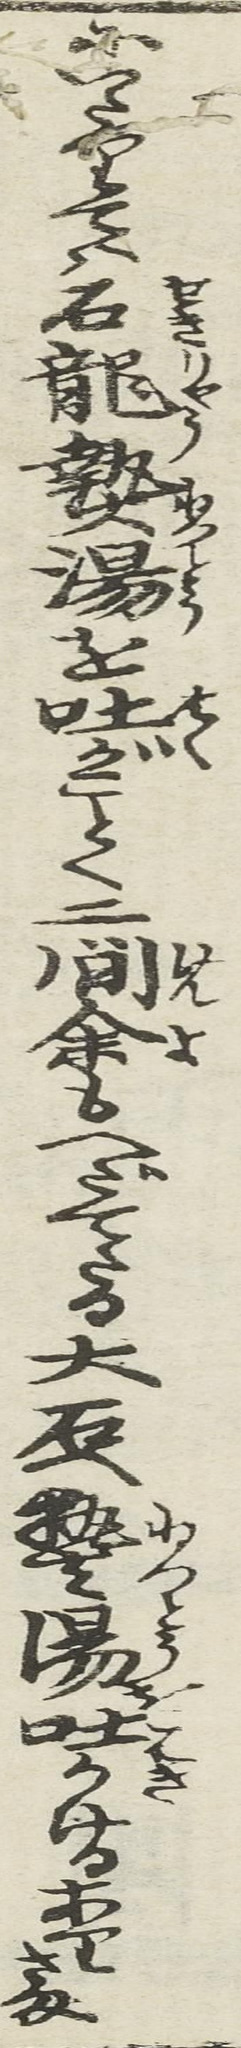にいたりては石龍熱湯を吐がことく二間余もへだてたる大石へ熱湯吐かけるありさま
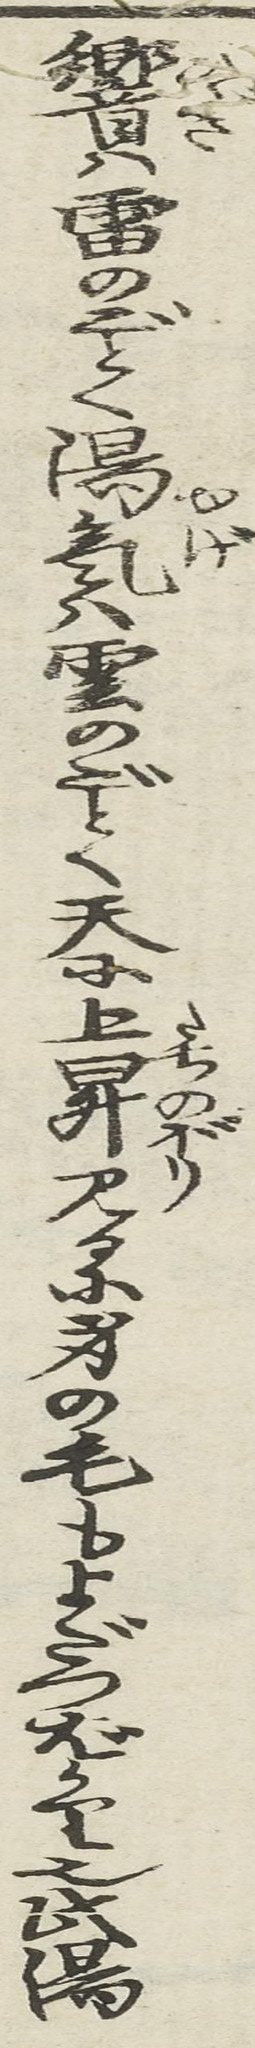響は雷のごとく湯気は雲のごとく天に上昇見るに身の毛もよだつばかり也此湯
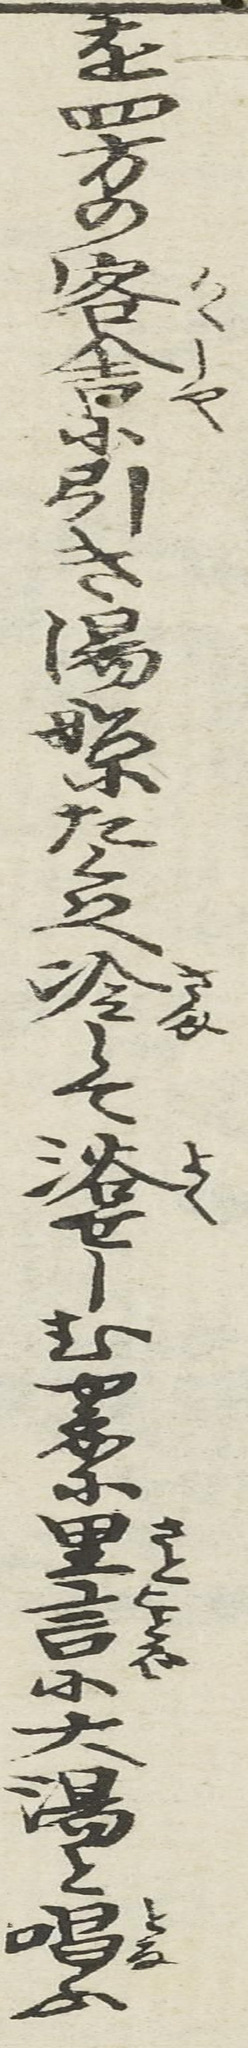を四方の客舎に引き湯船にたくはへ冷して浴せしむゆゑに里言に大湯と唱ふ
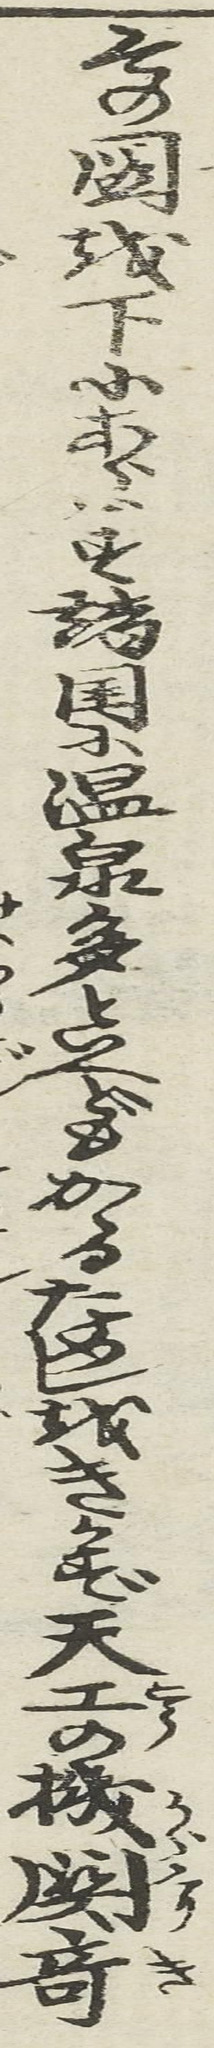その図を下にあらはす諸国に温泉多といへどもかゝるためしをきかず天工の機関奇
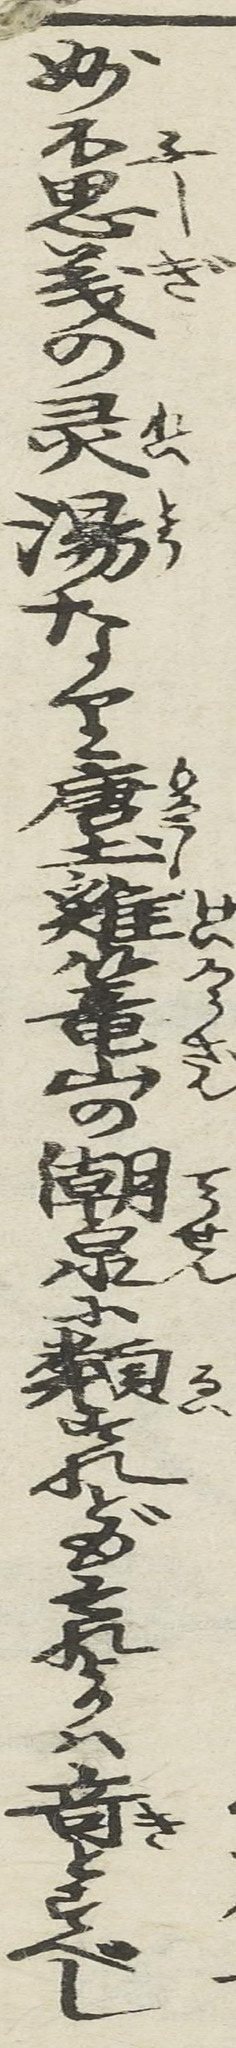妙不思義の霊湯なり唐土雞篭山の潮泉に類されどもそれよりは奇とすべし
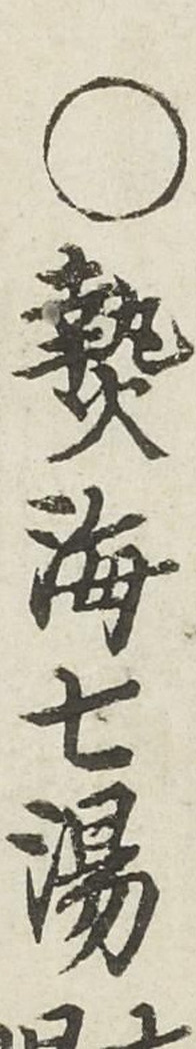○熱海七湯
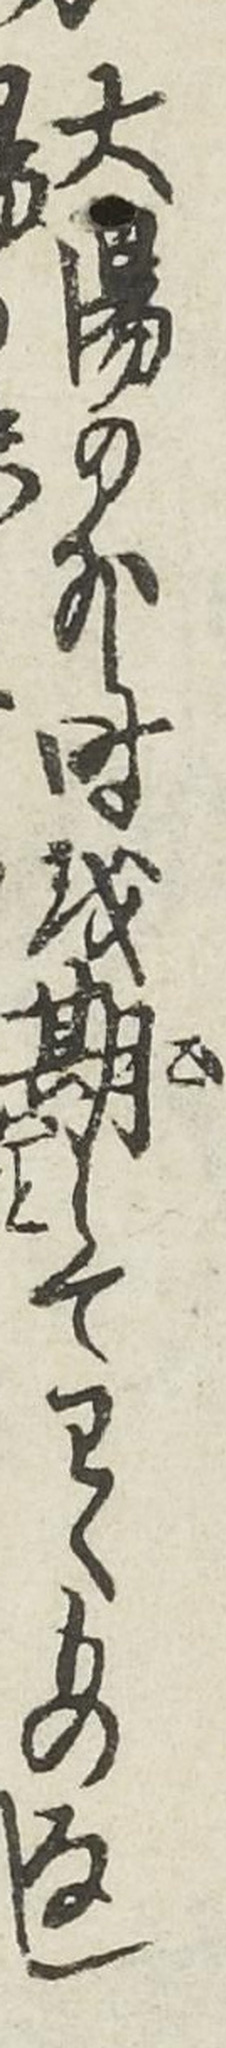大湯の外時を期してわくものなし
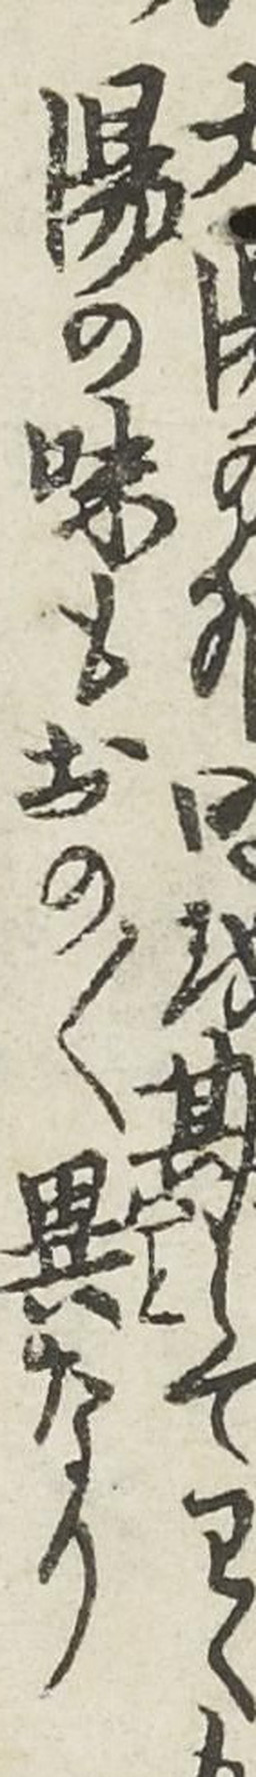湯の味もおの〳〵異なり
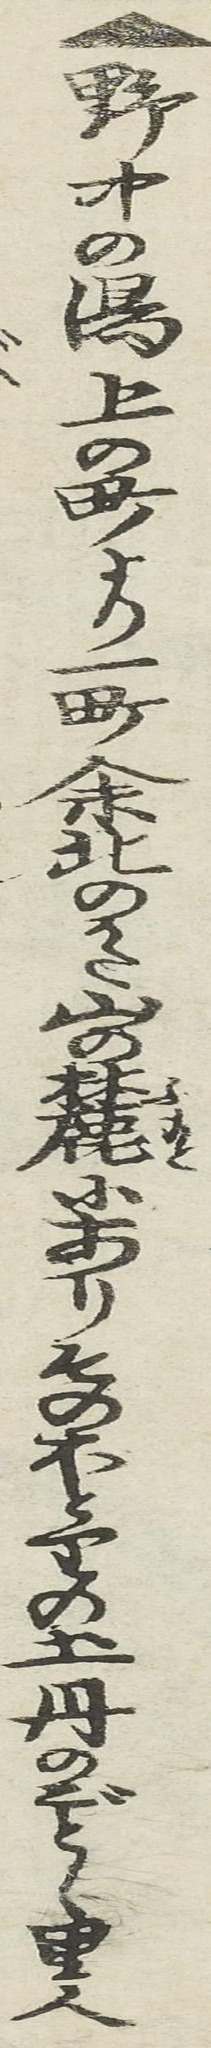▲野中の湯上の町より一町余北のかた山の麓にありそのほとりの土丹のごとく里人
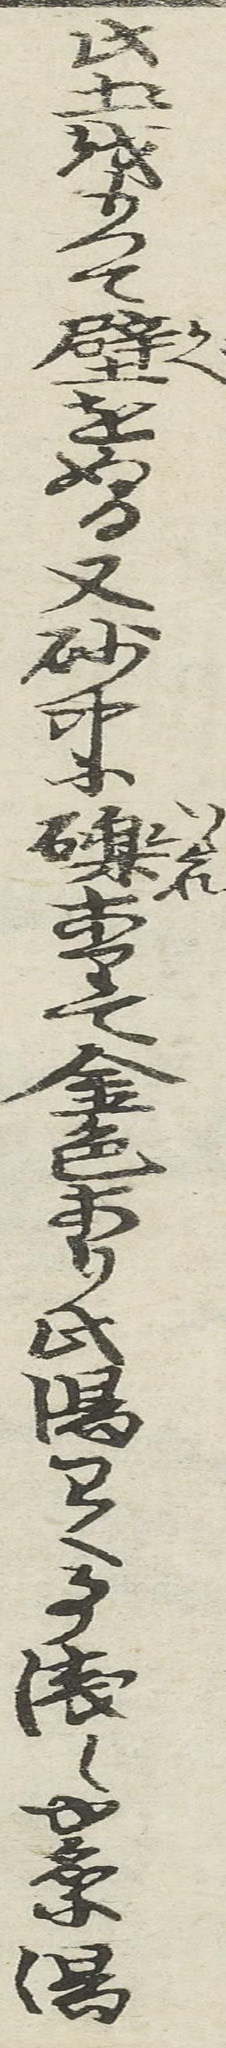此土をもつて壁をぬる又砂中に礫ありて金色あり此湯わく事浅しゆゑに湯
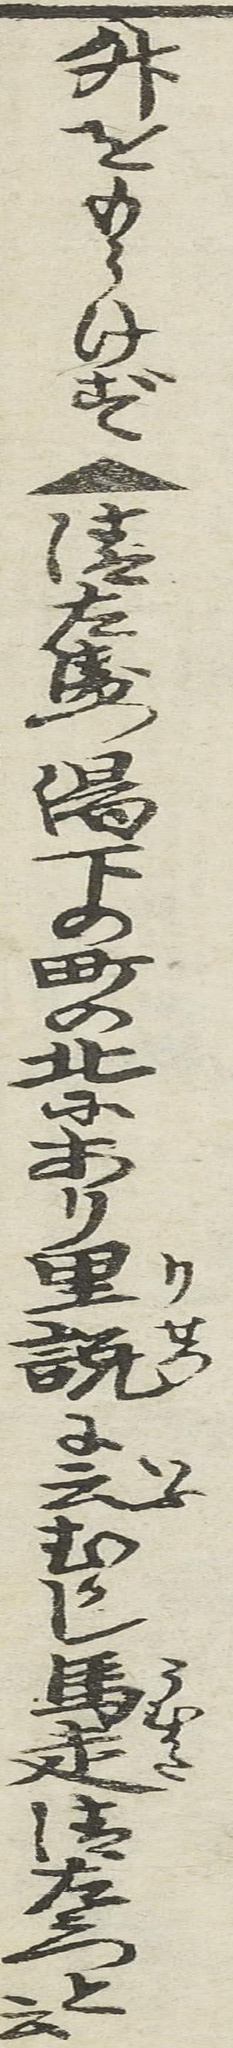升をもうけず▲清左衛門湯下の町の北にあり里説に云むかし馬走清左エ門と云

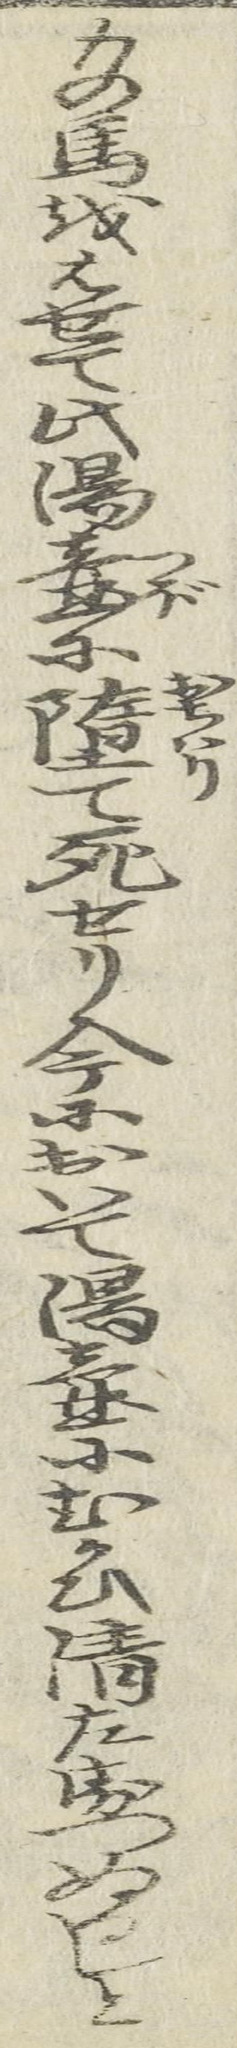もの馬をはせて此湯壺に堕て死せり今において湯壺にむかひ清左衛門ぬるしと
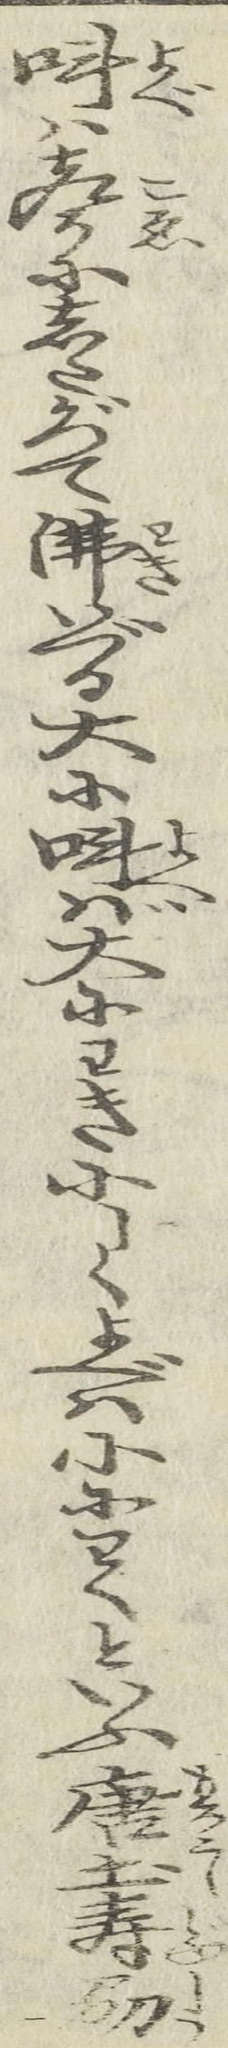呼ば声にしたがつて沸いづる大に呼ば大にわき小しくよべは小にわくといふ唐土寿州
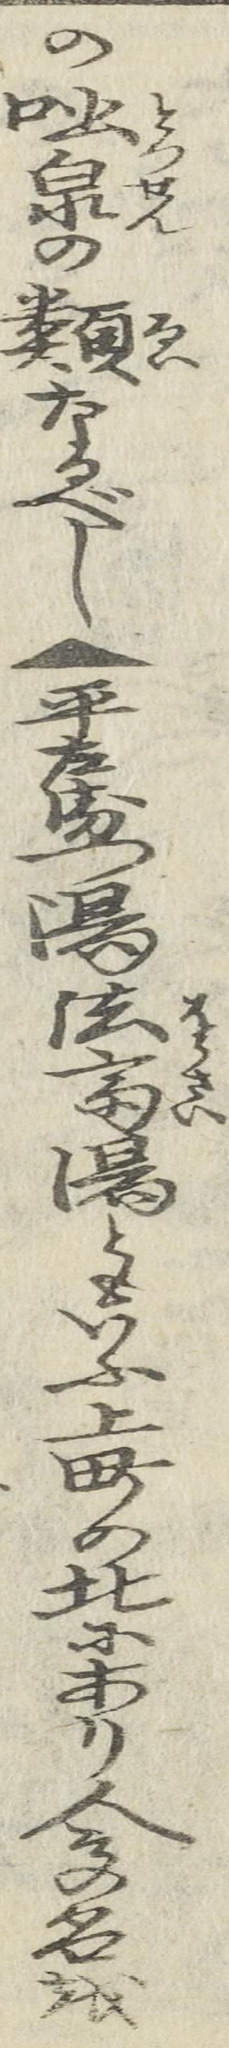の咄泉の類なるべし▲平左衛門湯法斎湯ともいふ上町の北にあり人その名を
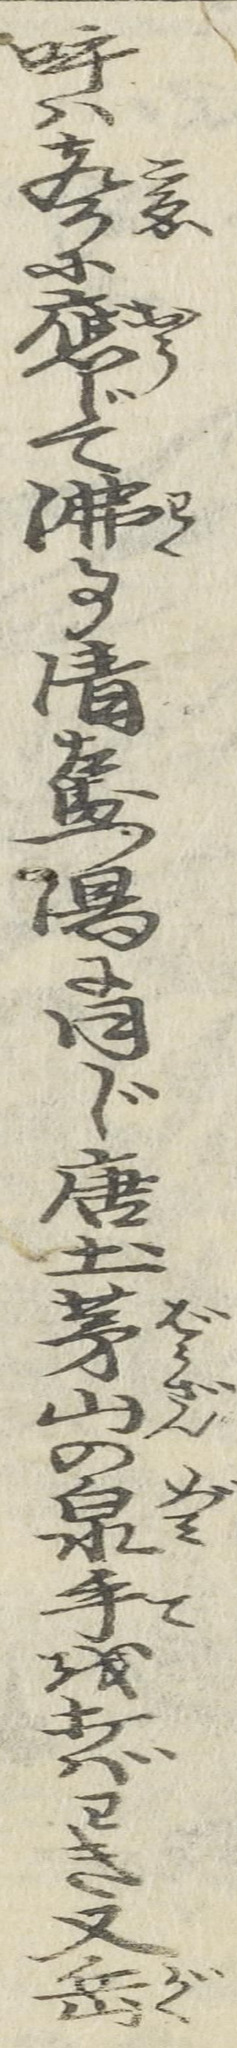呼は声に応じて沸事清左衛門湯に同じ唐土茅山の泉手を打ばわき又岳
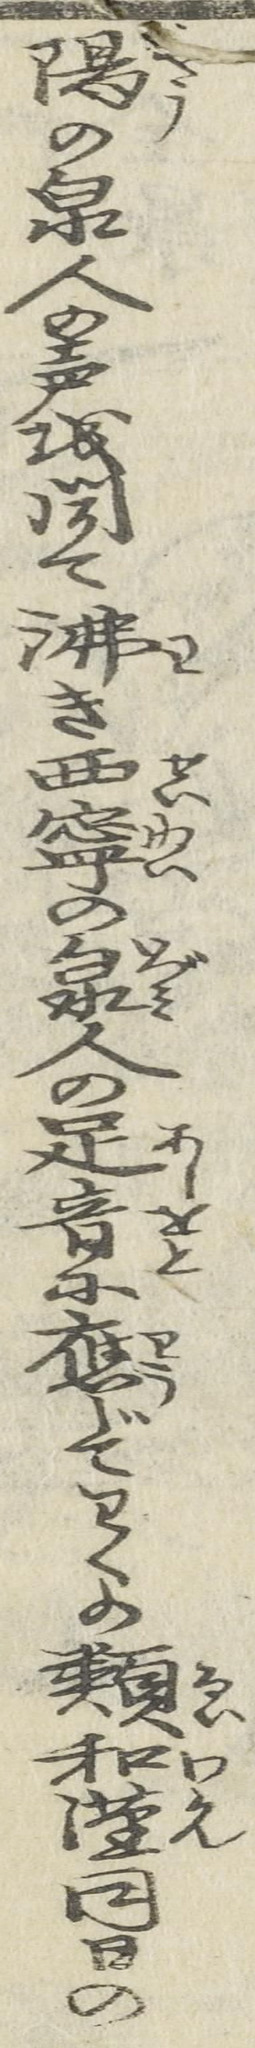陽の泉人の声を聞て沸き西寧の泉人の足音に応じてわくの類和漢同日の
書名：熱海温泉圖彙
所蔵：東京大学地震研究所図書室 Earthquake Research Institute Library, The University of Tokyo, JAPAN
